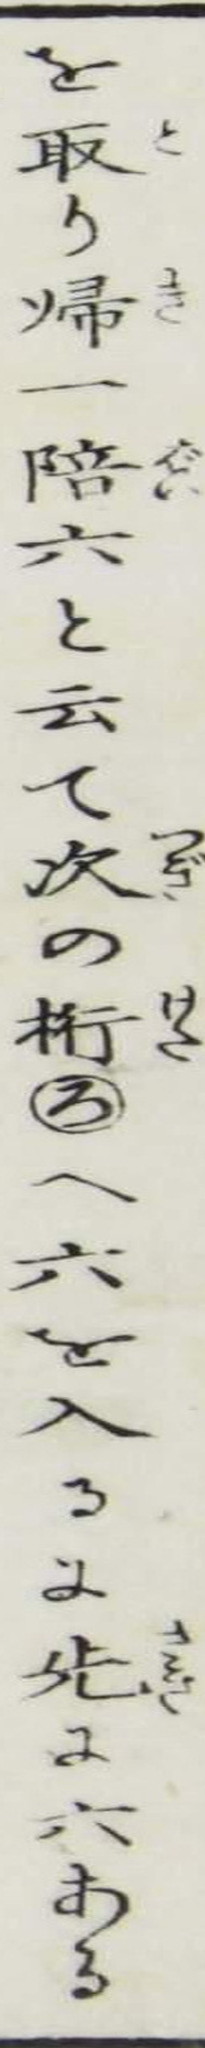を取り帰一陪六と云て次の桁㋺へ六を入るに先に六ある
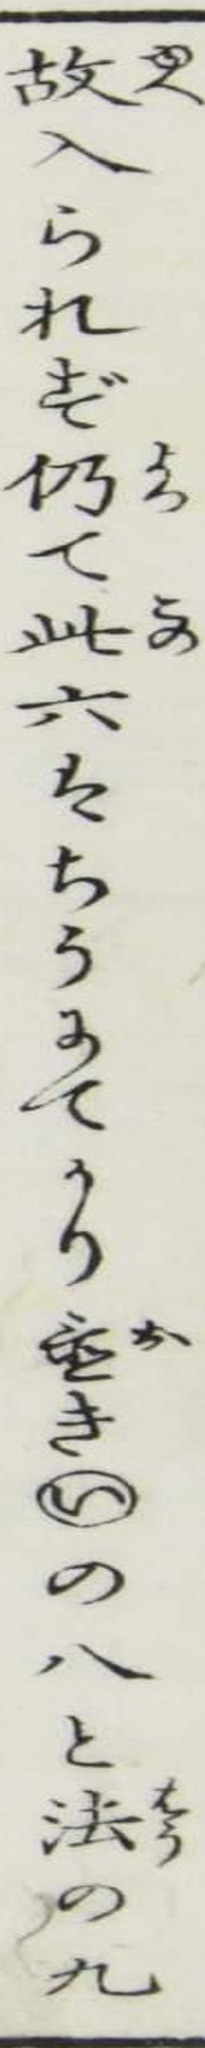故入られず仍て此六はちうにてかり置き㋑の八と法の九
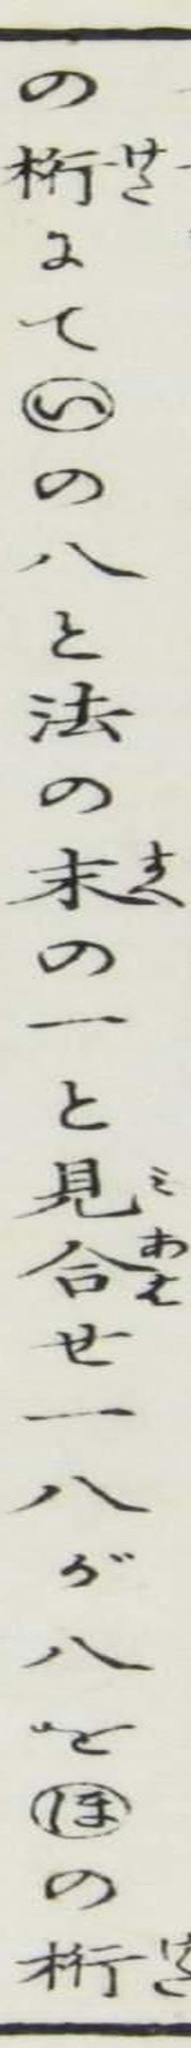の桁にて㋑の八と法の末の一と見合せ十八が八を㋭の桁
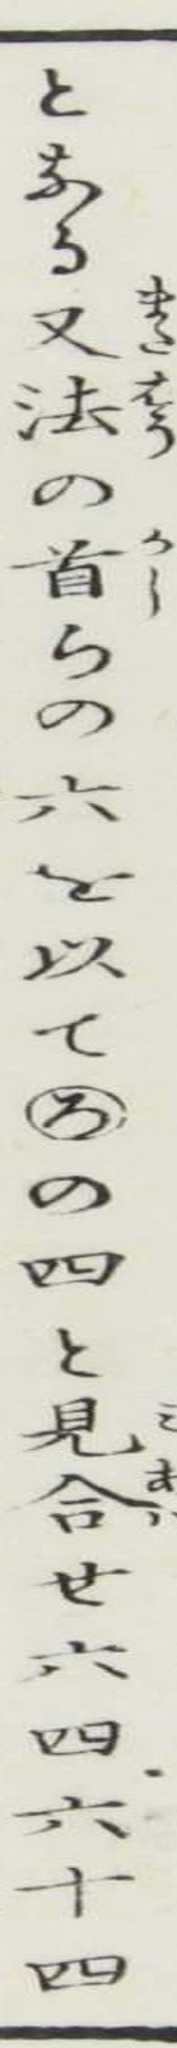となる又法の首らの六を以て㋺の四と見合せ六四．六十四
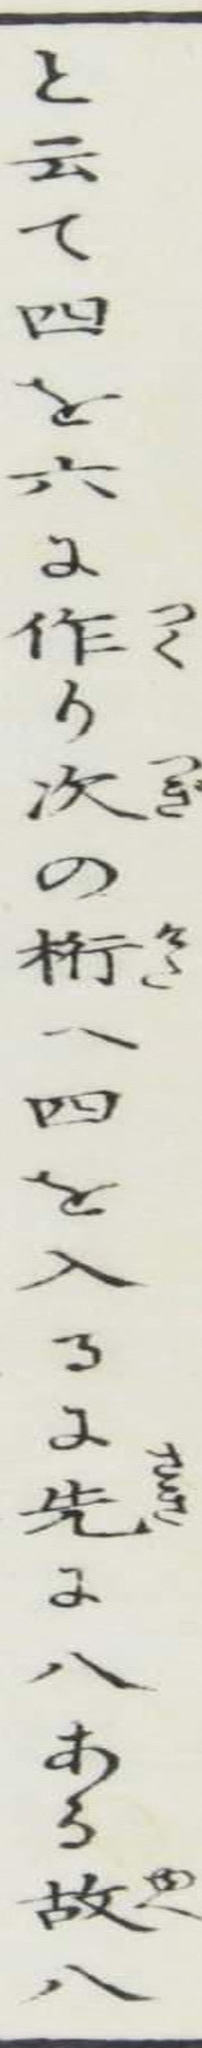と云て四を六に作り次の桁へ四を入るに先に八ある故八
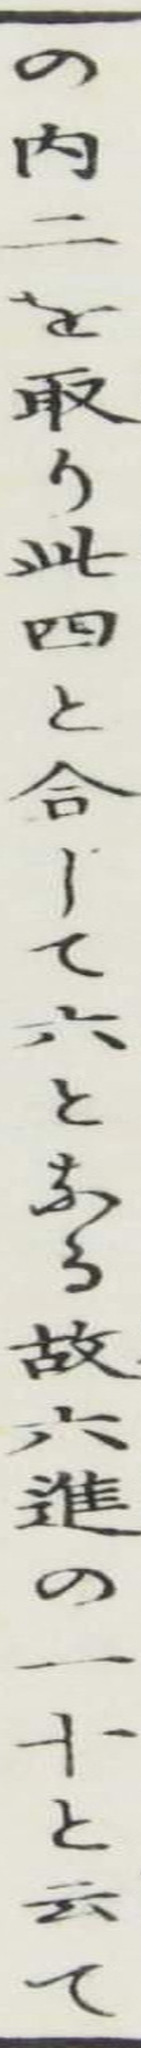の内二を取り此四と合して六となる故六進の一十と云て
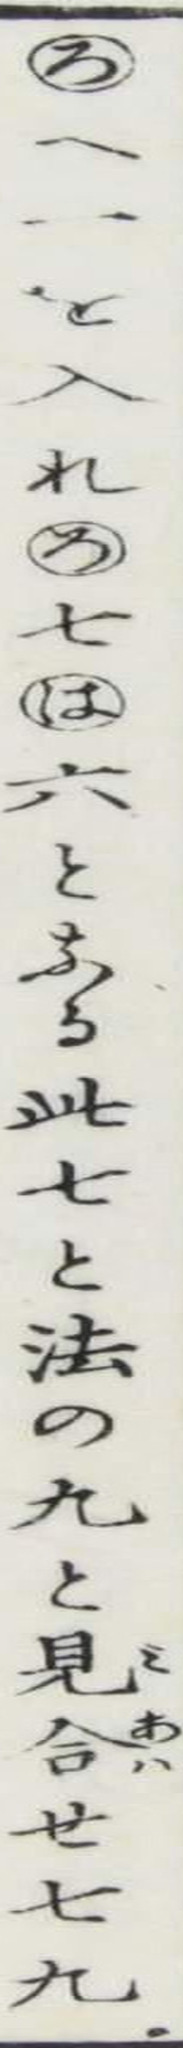㋺へ一を入れ㋺七㋩六となる此七と法の九と見合せ七九．
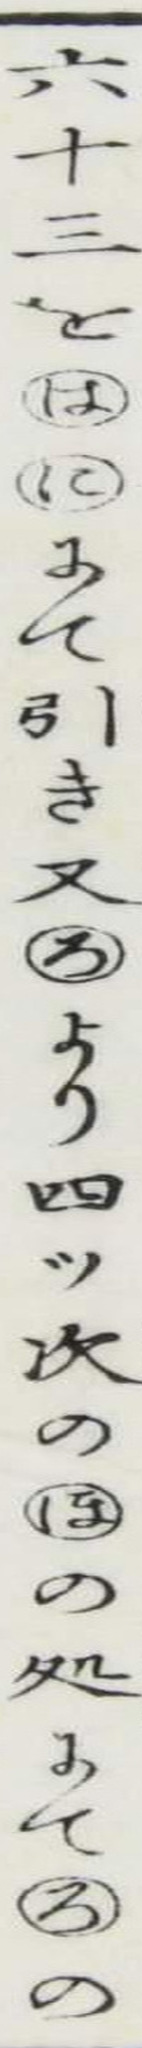六十三を㋩㋥にて引き又㋺より四ッ次の㋭の処にて㋺の
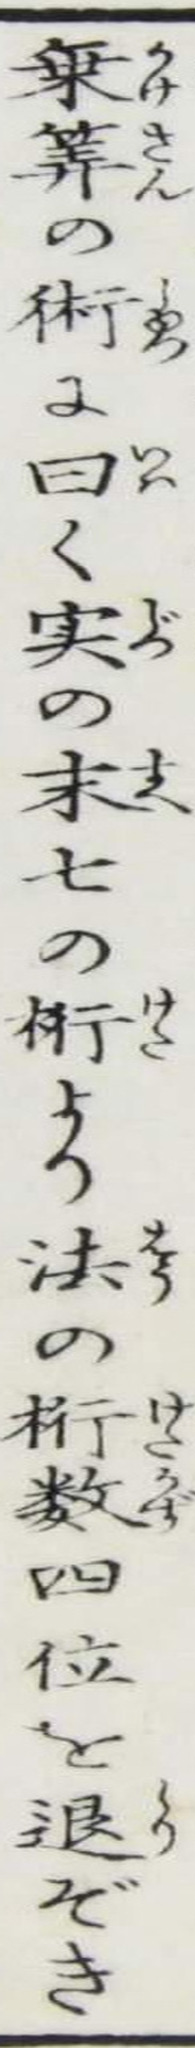乗算の術に曰く実の末七の桁より法の桁数四位を退ぞき
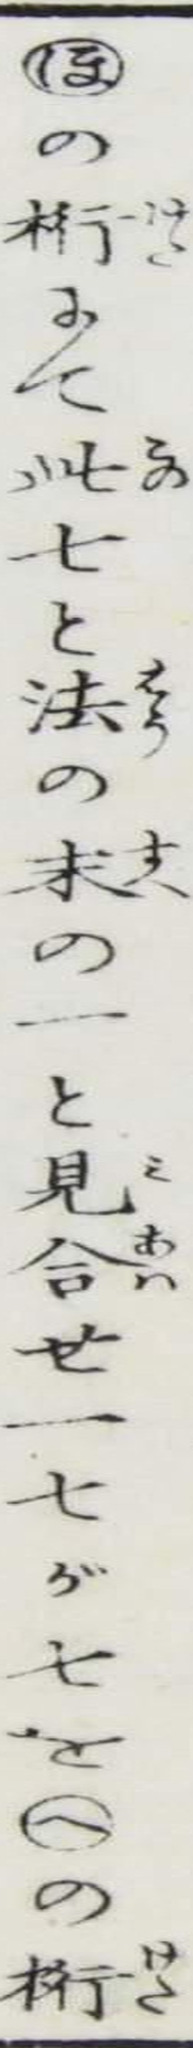㋭の桁にて此七と法の末の一と見合せ十七が七を㋬の桁
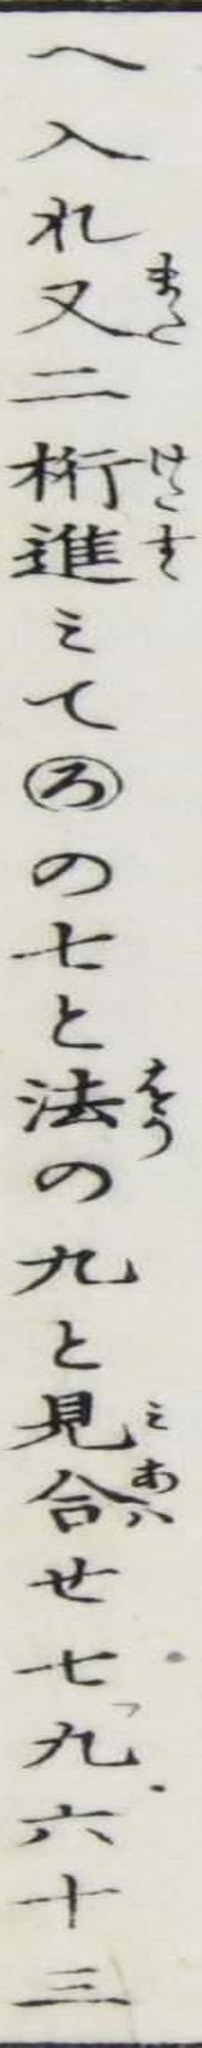へ入れ又二桁進みて㋺の七と法の九と見合せ七九．六十三
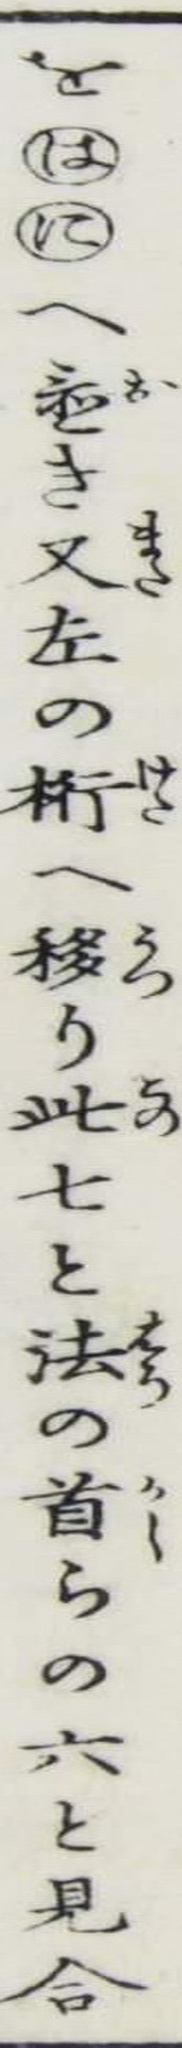を㋩㋥へ置き又左の桁へ移り此七と法の首らの六と見合
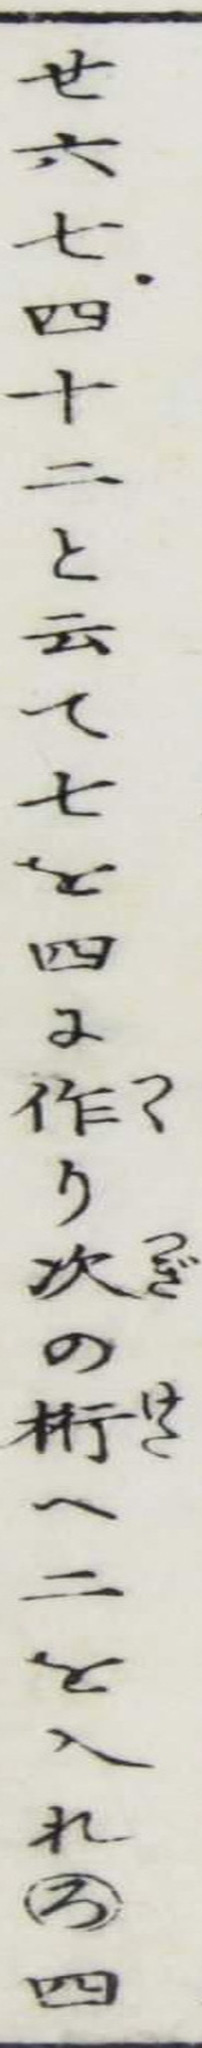せ六七．四十二と云て七を四に作り次の桁へ二を入れ㋺四
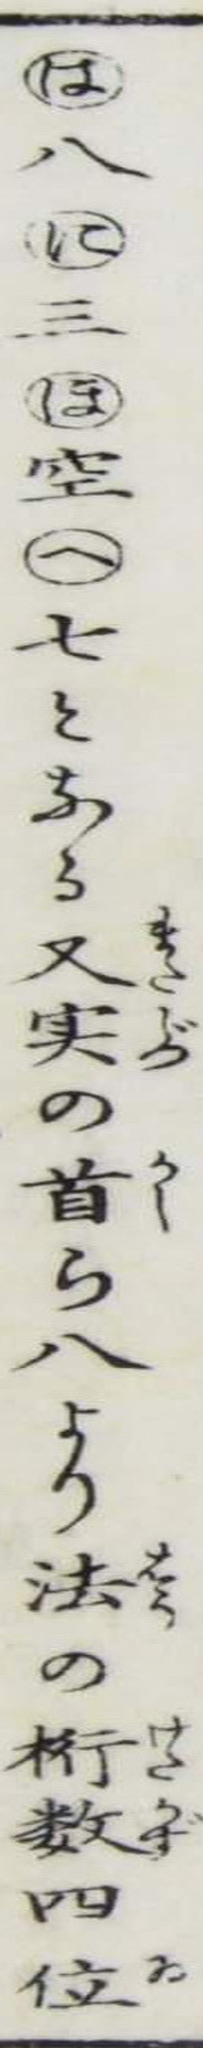㋩八㋥三㋭空㋬七となる又実の首ら八より法の桁数四位
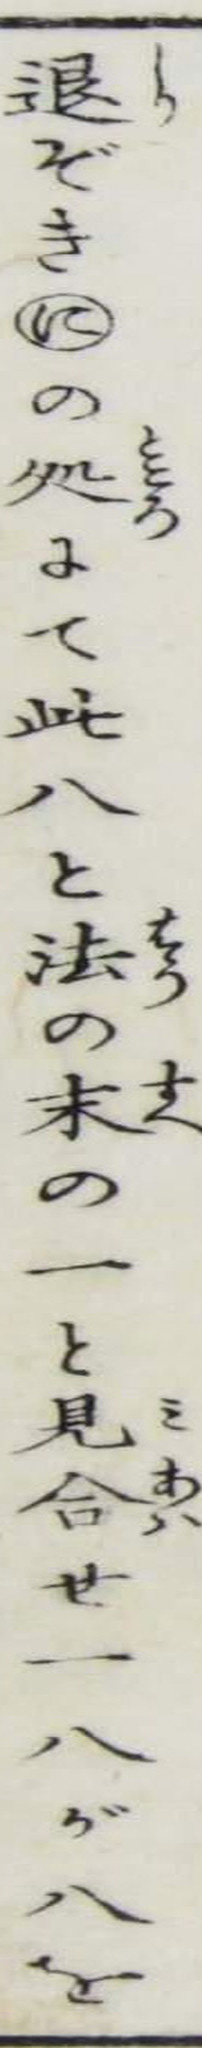退ぞき㋥の処にて此八と法の末の一と見合せ十八が八を

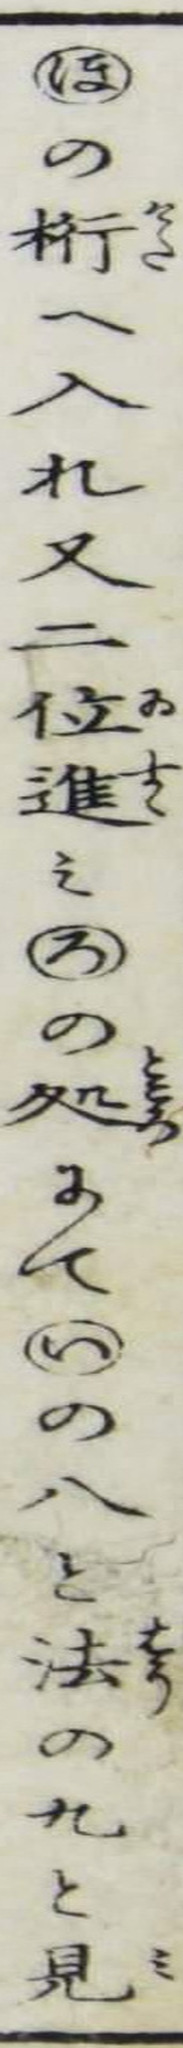㋭の桁へ入れ又二位進み㋺の処にて㋑の八と法の九と見
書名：明治小學塵劫記 卷1
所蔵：東京学芸大学教育コンテンツアーカイブ
